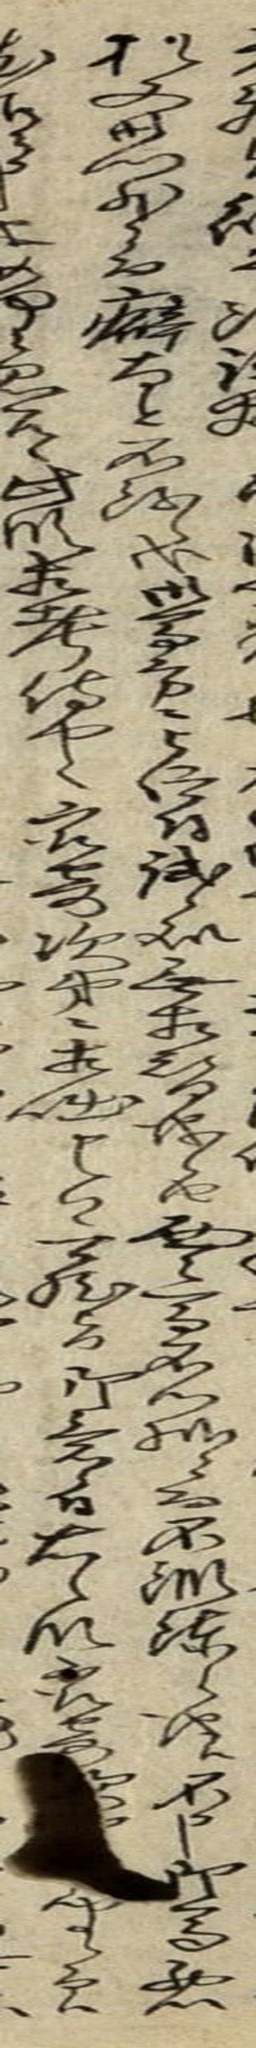敷様に申儀如何に思召候此段相考侍中へ最寄次第に相咄申候はゝ可然旨御意候付右之段最寄次第聞候ては
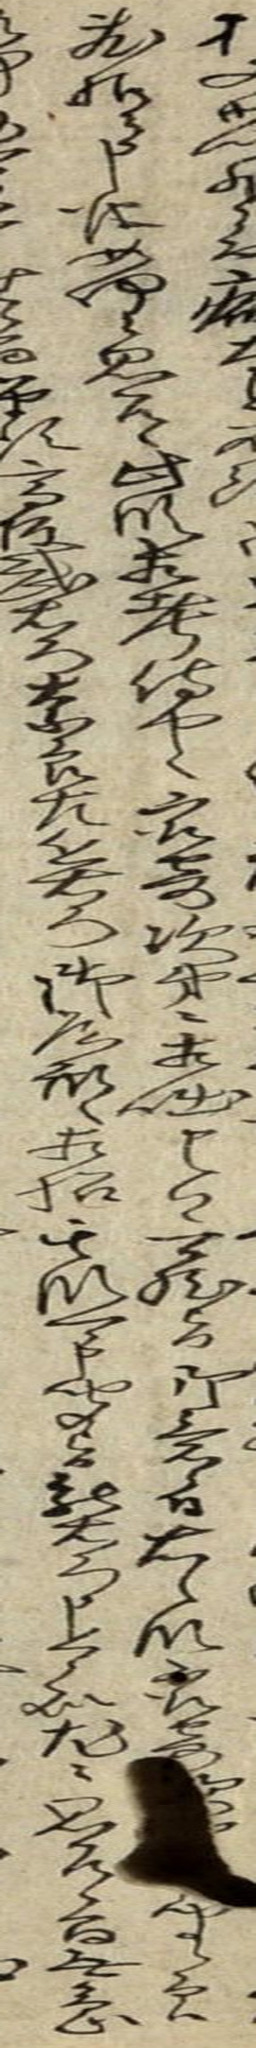如何にも可有御座候間筆頭高坂武右衛門奈良左近右衛門御屋形へ相招其段可申聞旨新右衛門申上候処尤に思召候間無急
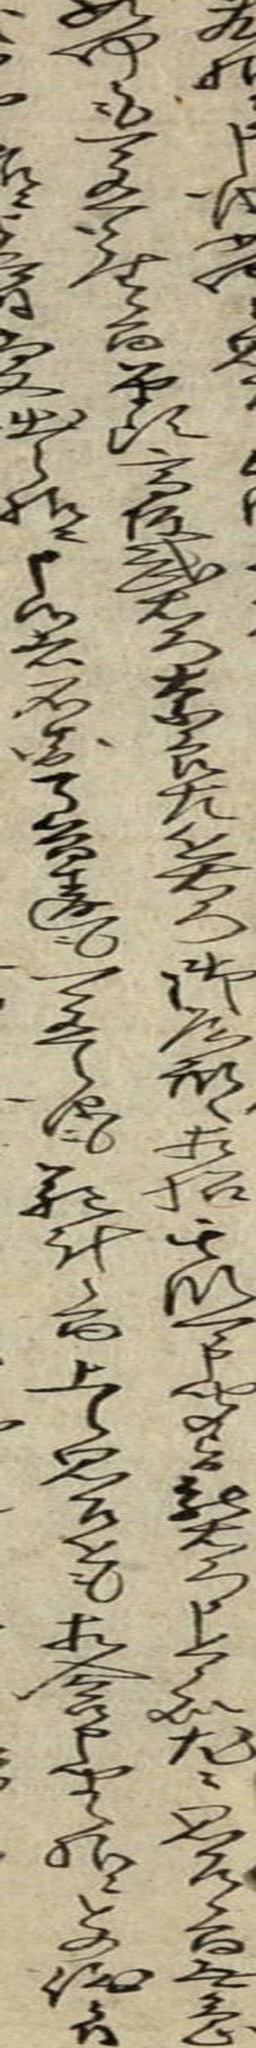度申聞候様に被仰付尚又咄候様に申候は不図了簡違も可有之儀も難計候間上之思召をも相含申聞候様にとの儀に付
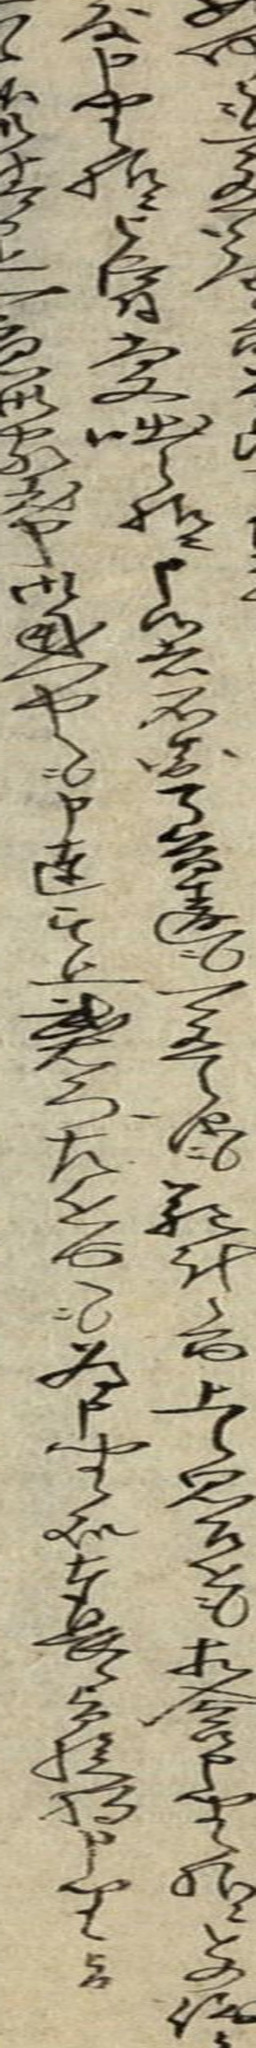右之趣御請申上一応御家老中御用人中へも申達其上武右衛門左近右衛門へも為申聞候処奉畏候旨挨拶申聞候旨
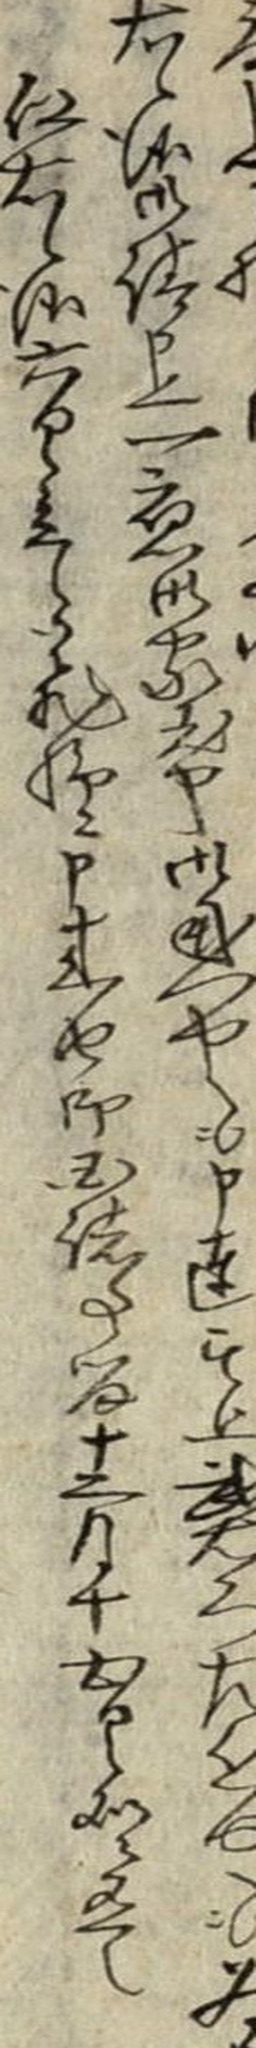但右之趣六日之立候御飛脚に申来由御国諸事留十二月十五日之処に有之
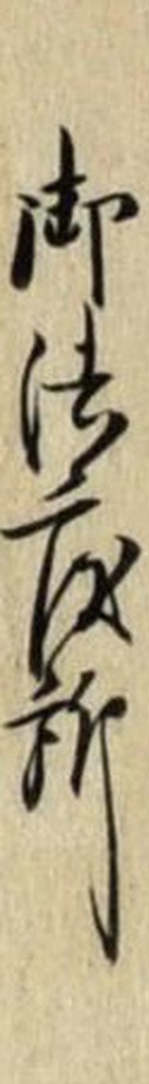御法度所
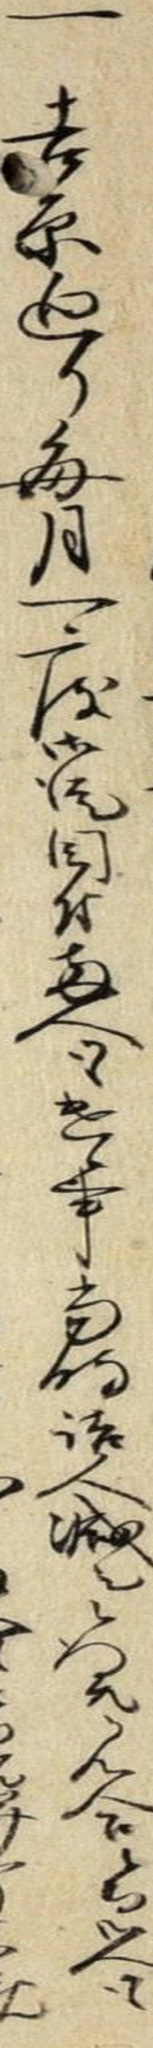一吉原廻り毎月一度御徒目付両人つゝ遣候事当時詰人減し候得共見合候て弐人つゝ
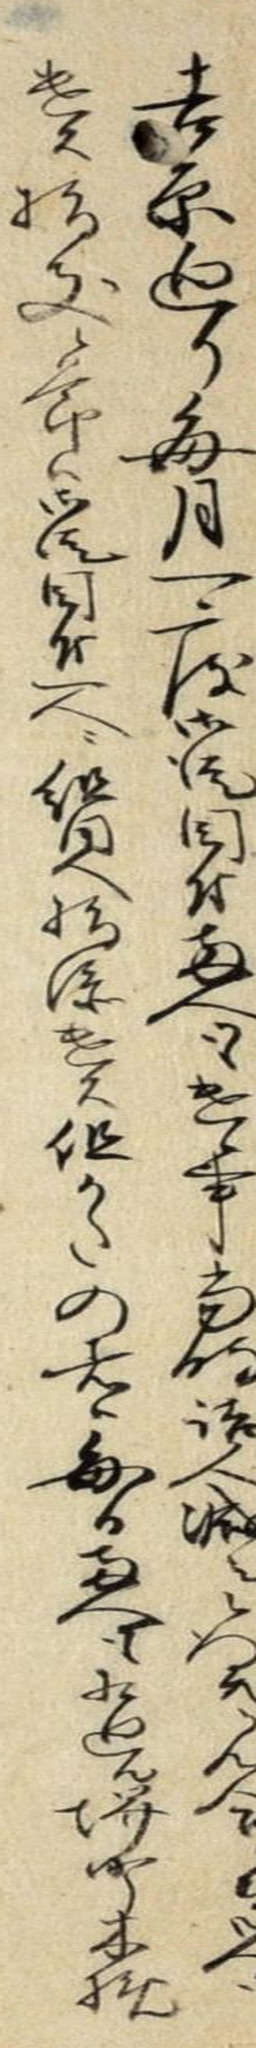遣す指支候節は御徒目付一人に組用人指添遣す組かたの者は毎日両人つゝ相廻る堺町木挽
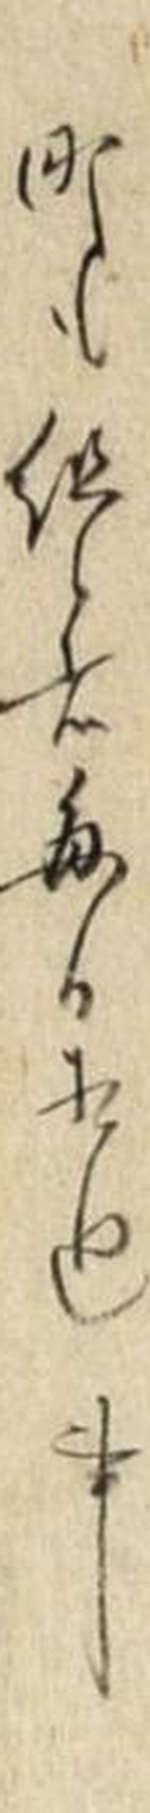町も組之者毎日相廻事
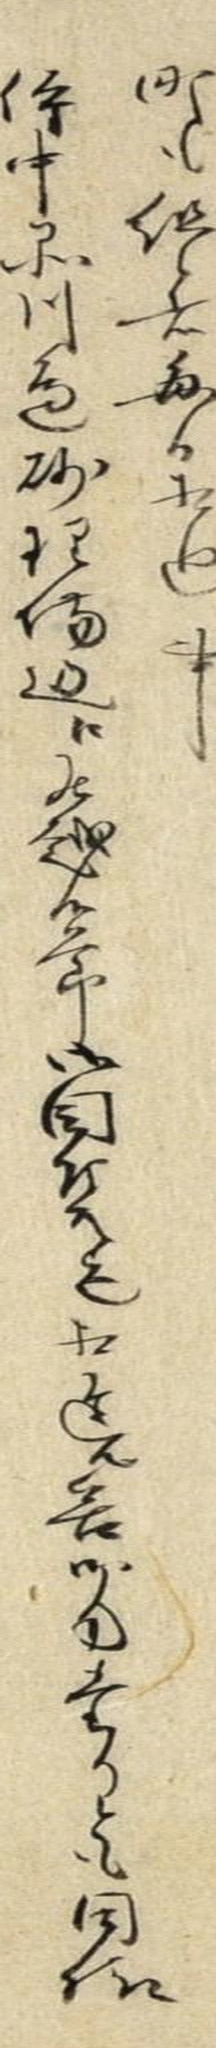一侍中品川辺砂理場辺江罷越候節御目付共迄相達る筈御用たりとも同様
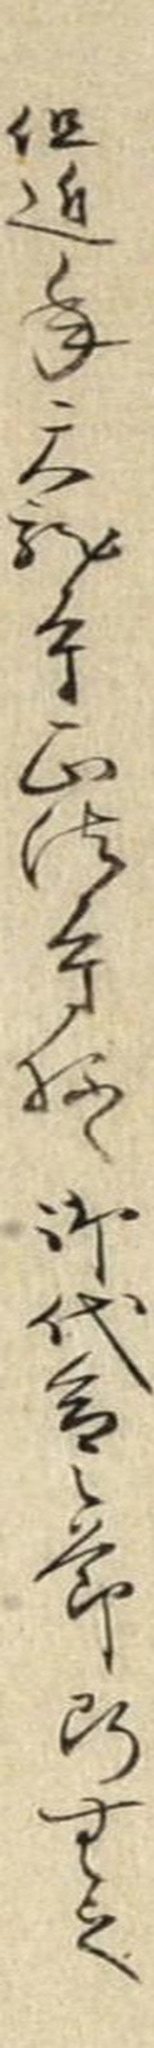但近年天龍寺正法寺抔へ御代参之節断無之
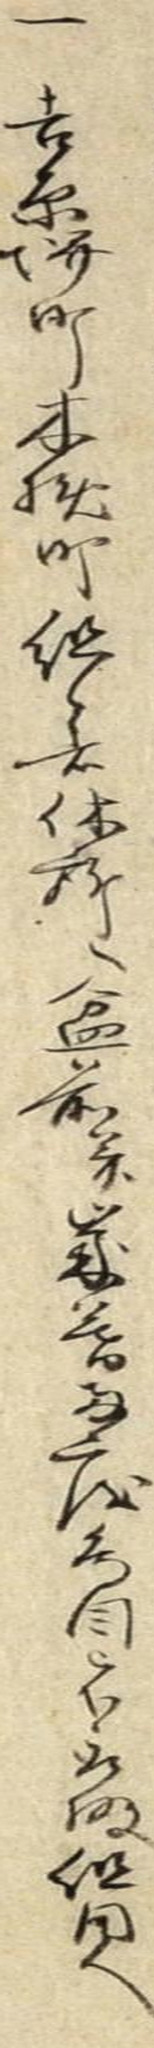一吉原堺町木挽町組之者休所へ盆前并歳暮両度鳥目被下取扱組用人
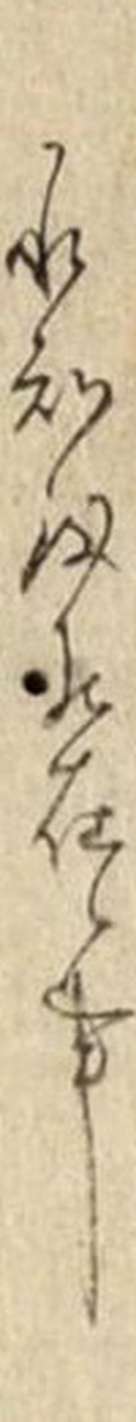承知致罷在候事

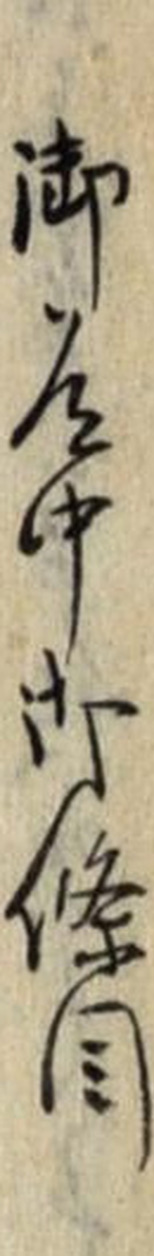御道中御条目
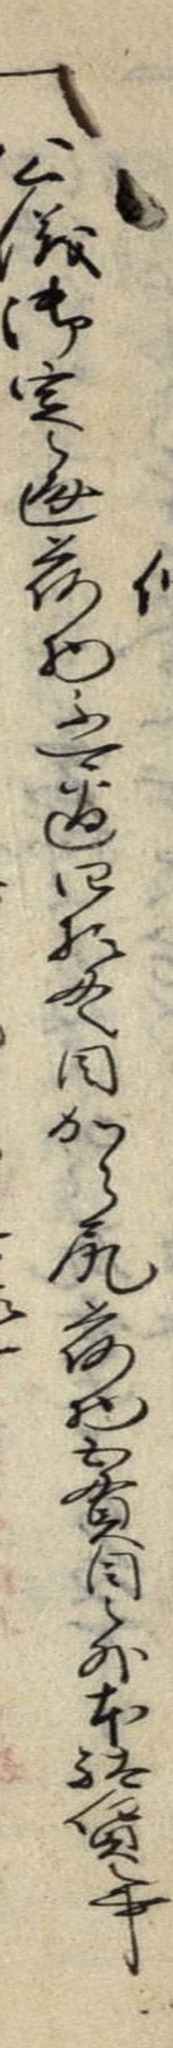一公儀御定之通荷物不可過四拾貫目から尻荷物五貫目之外本駄賃之事
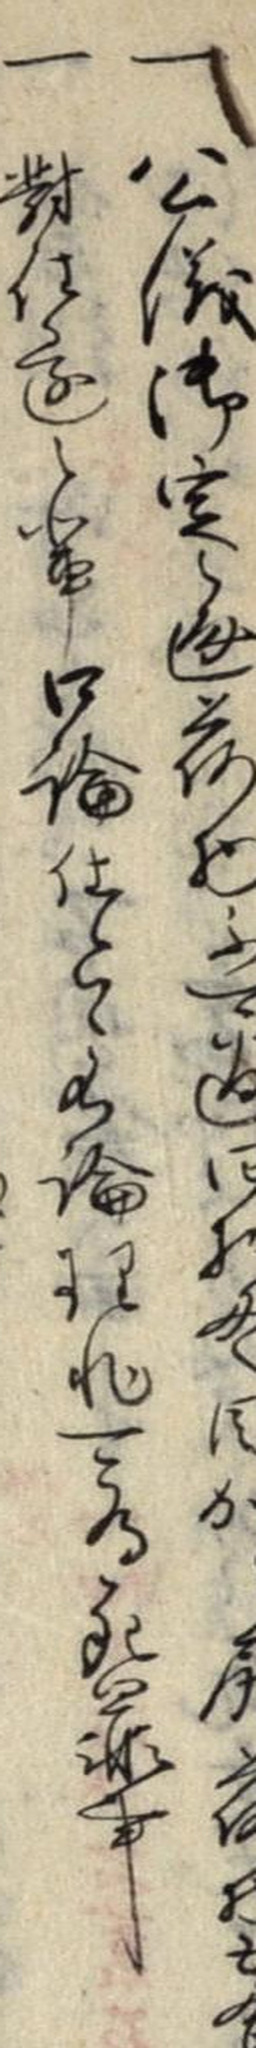一対往還之輩口論仕候はゝ不論理非可為死罪事
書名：三都并道中之部
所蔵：福井県文書館 Fukui Prefectural Archives
